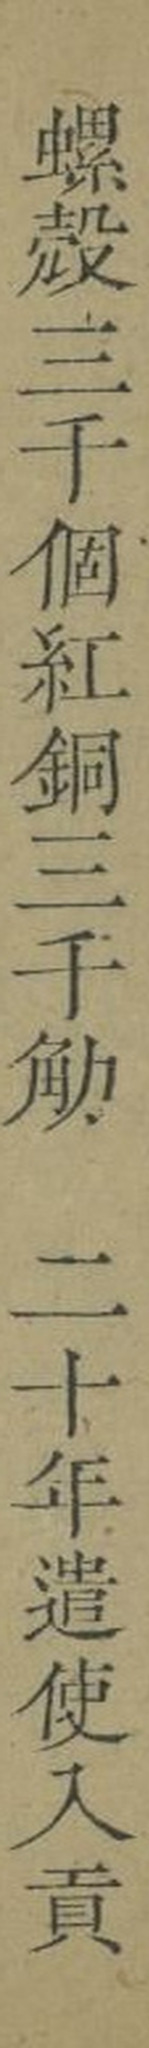螺殻三千個紅銅三千觔二十年遣使入貢
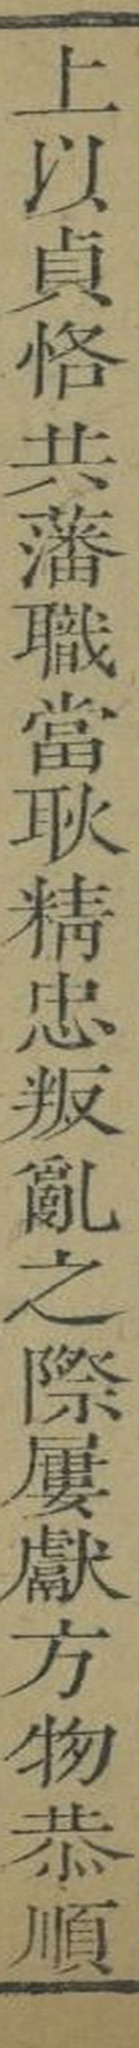上以貞恪共藩職当耿精忠叛乱之際屢献方物恭順
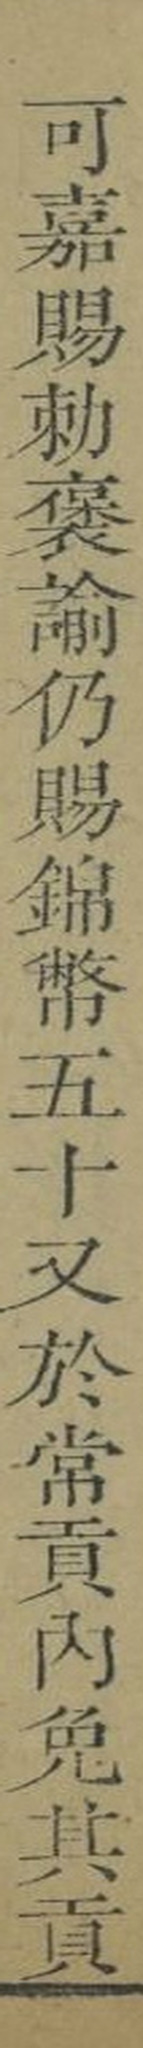可嘉賜勅褒諭仍賜錦幣五十又於常貢内免其貢
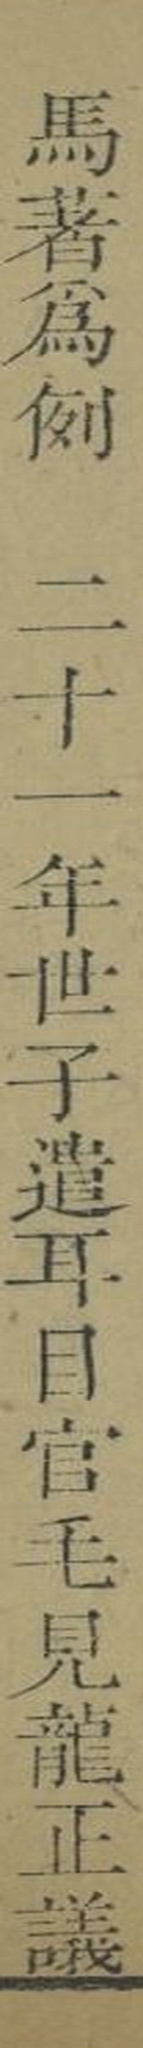馬著為例二十一年世子遣耳目官毛見竜正議
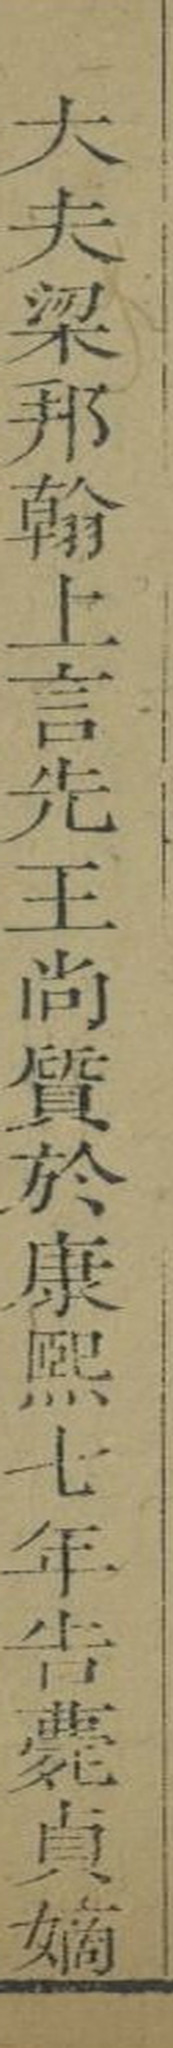大夫梁邦翰上言先王尚質於康煕七年告薨貞嫡
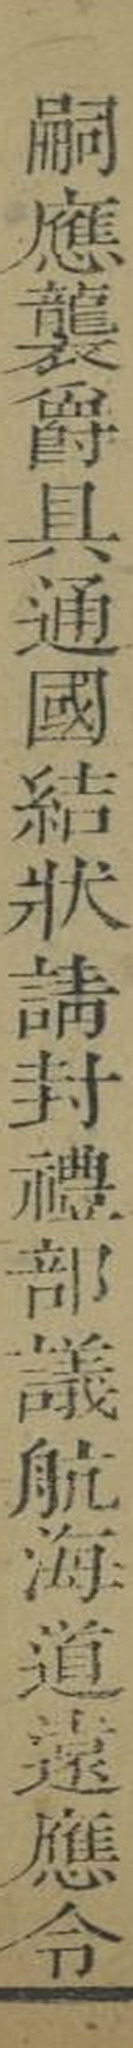嗣応襲爵具通国結状請封礼部議航海道遠応令
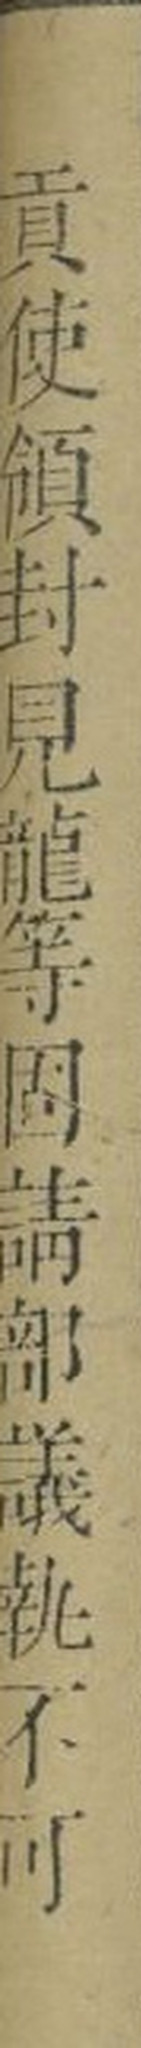貢使領封見竜等固請部議執不可
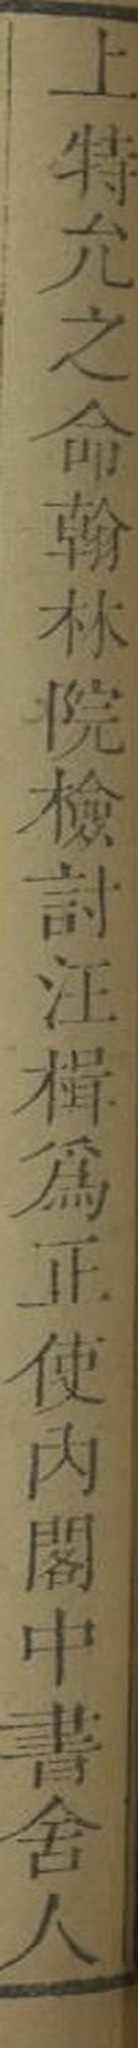上特允之命翰林院検討汪楫為正使内閣中書舎人
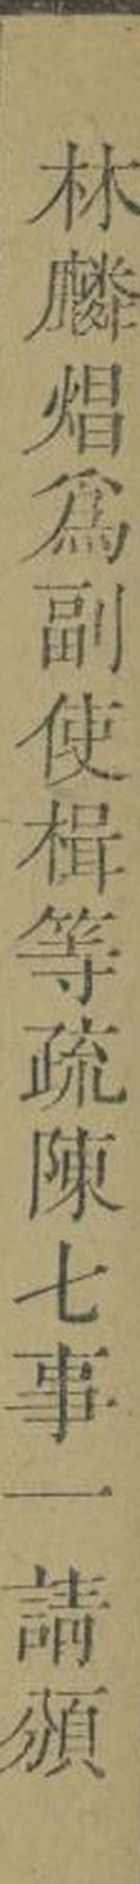林麟焻為副使楫等疏陳七事一請頒
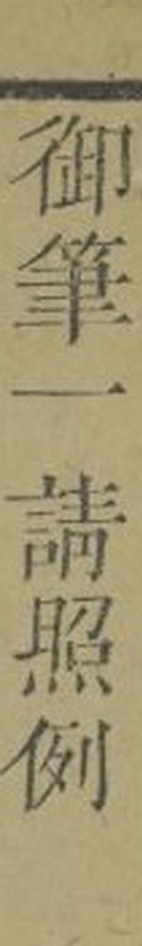御筆一請照例
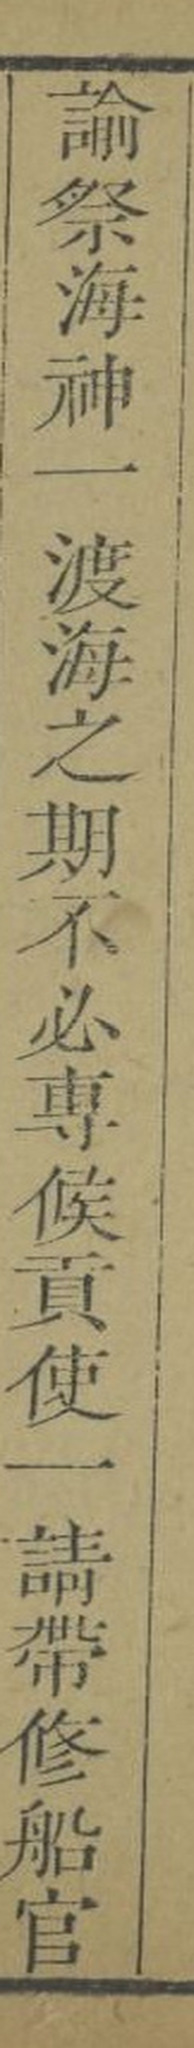諭祭海神一渡海之期不必専候貢使一請帯修船官
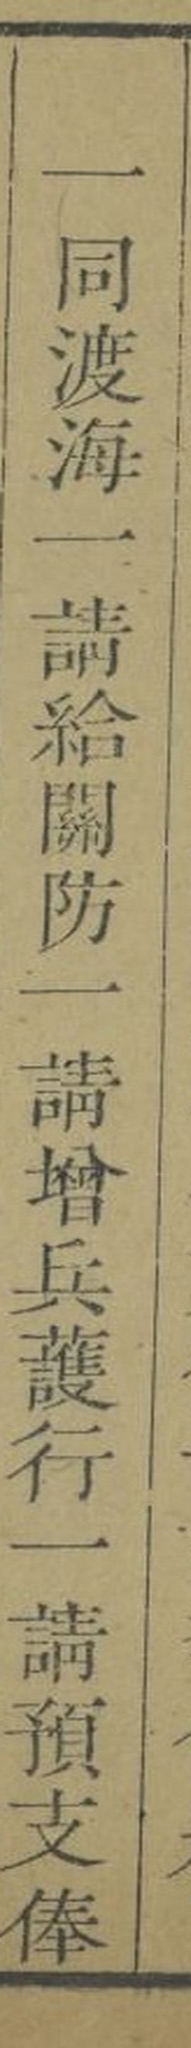一同渡海一請給関防一請増兵護行一請預支俸
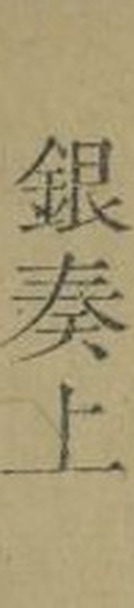銀奏上
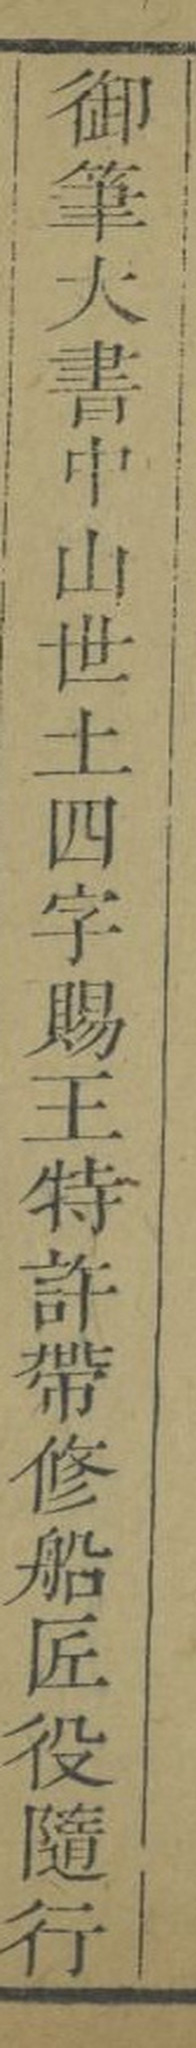御筆大書中山世土四字賜王特許帯修船匠役随行
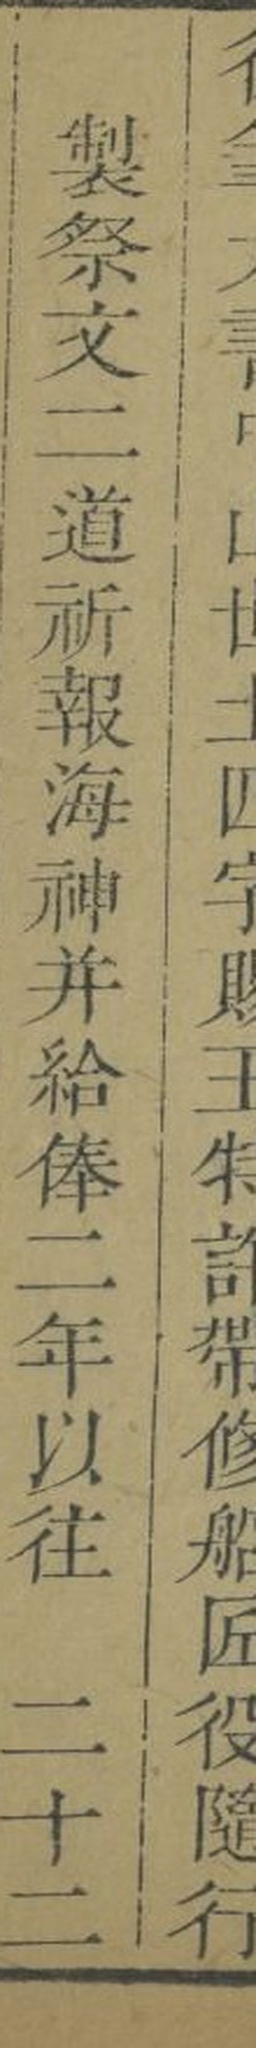製祭文二道祈報海神幷給俸二年以往二十二
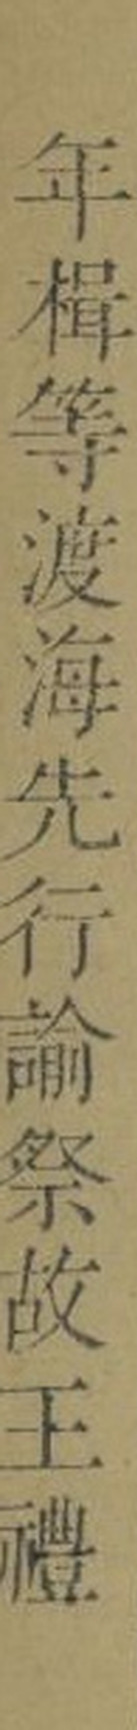年楫等渡海先行諭祭故王礼
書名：中山伝信録 巻四
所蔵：University of the Ryukyus Library
